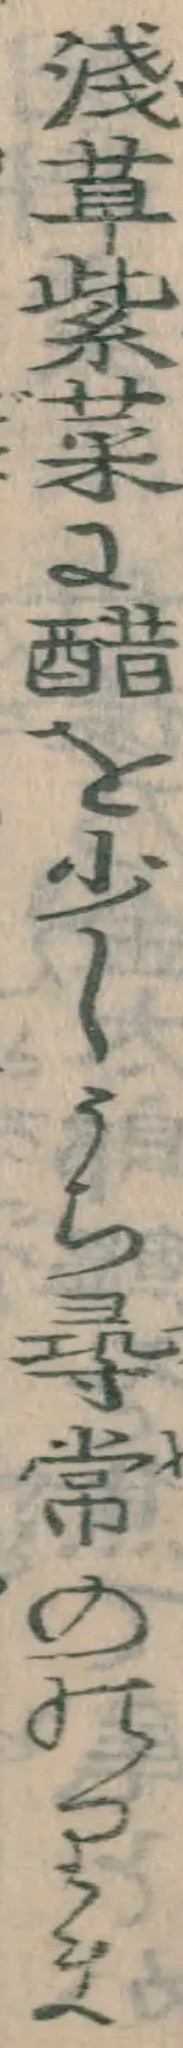浅草紫菜に醋を少しうち尋常ののりま
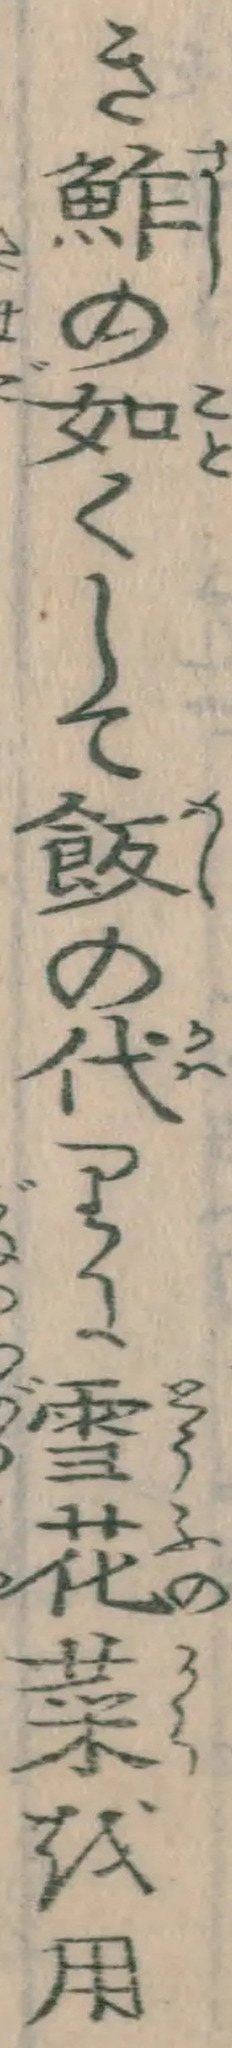き酢の如くして飯の代りに雪花菜を用
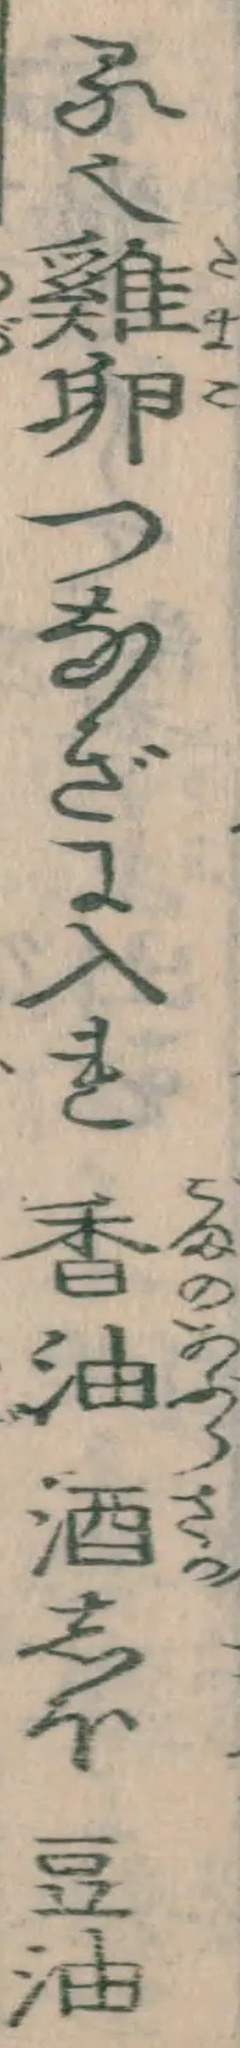る也鶏卵つなぎに入れ香油酒しほ豆油
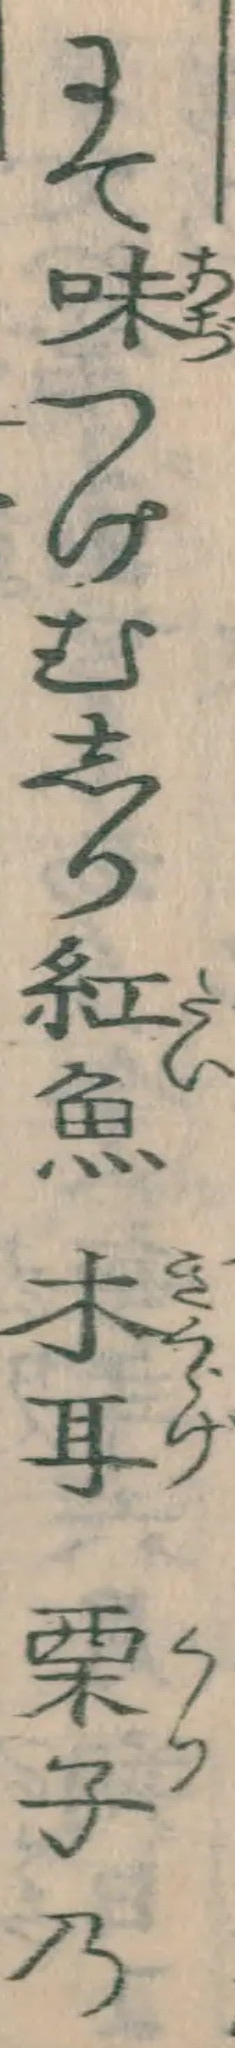にて味つけむしり紅魚木耳栗子の
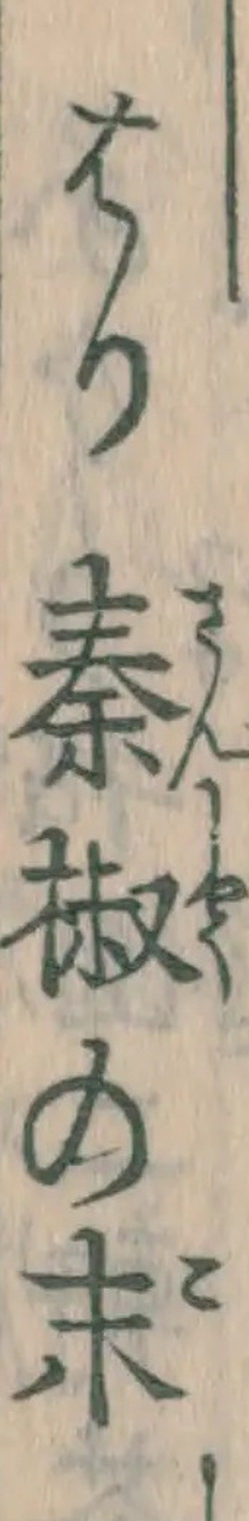はり秦椒の末
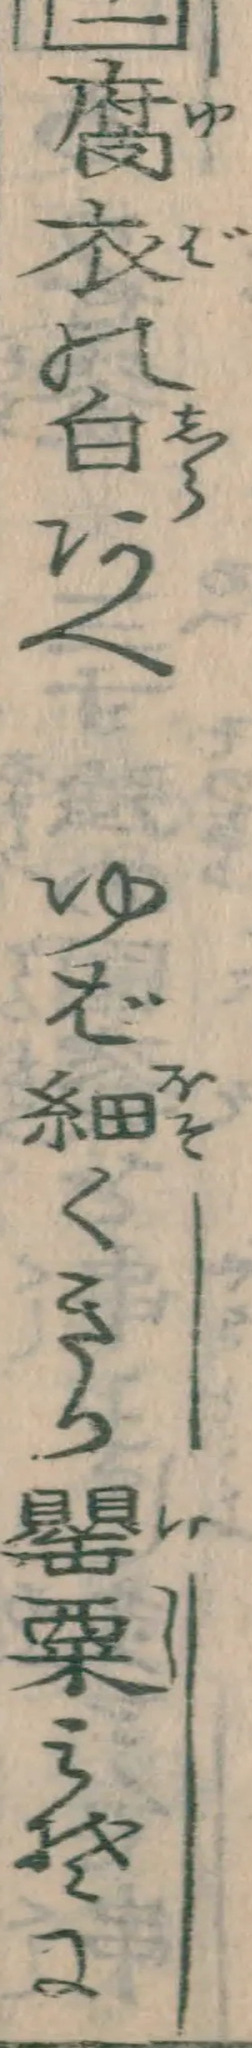十一腐衣の白あへゆば細くきり罌粟みそに
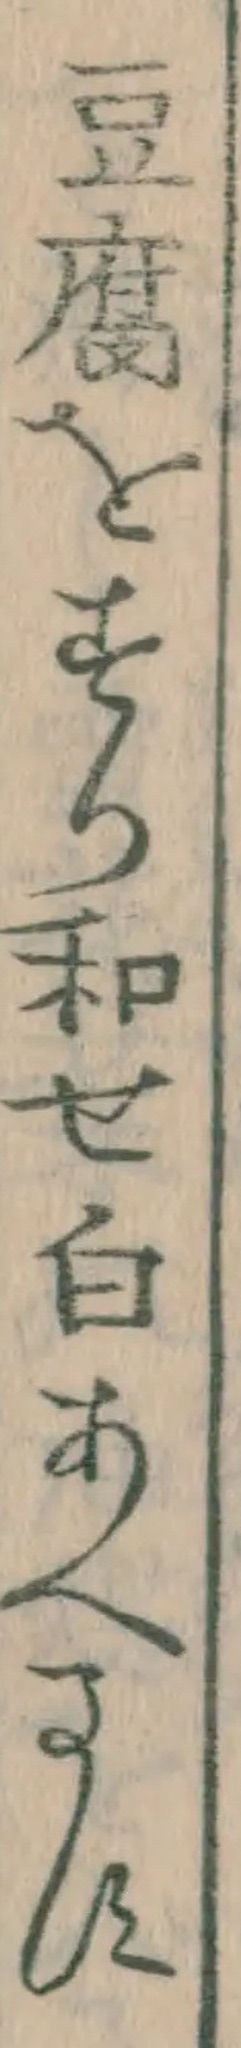豆腐をすり和せ白あへにす
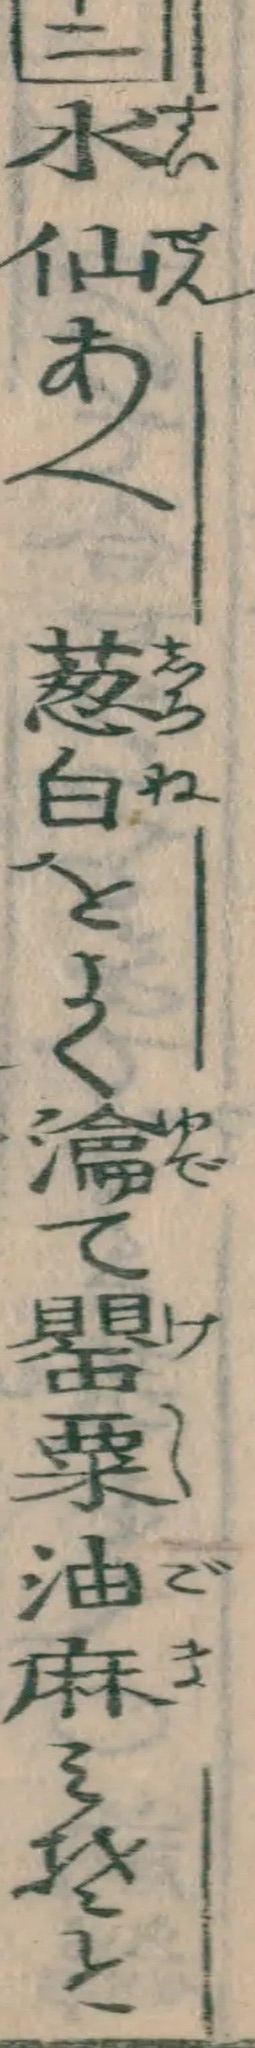十二水仙あへ葱白をよく瀹て罌粟油麻みそを
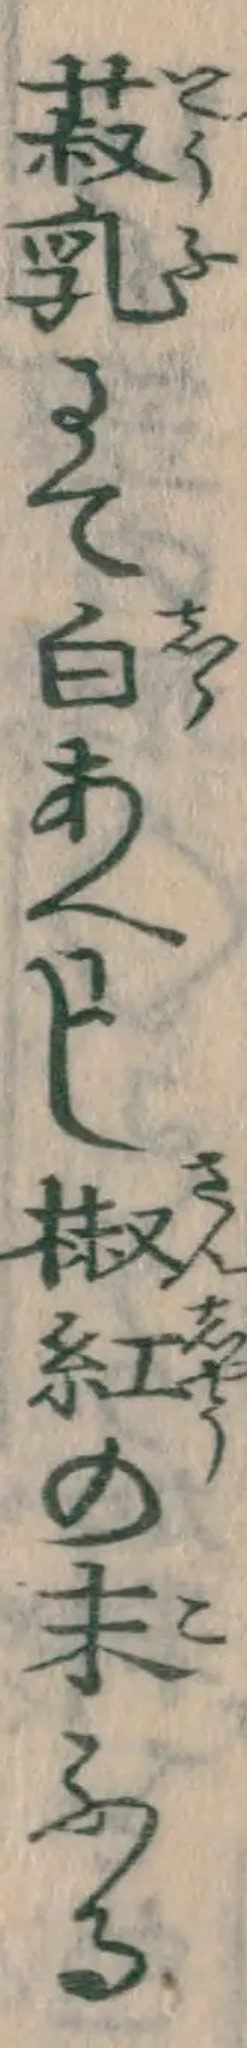菽乳にて白あへにし椒紅の末ふる
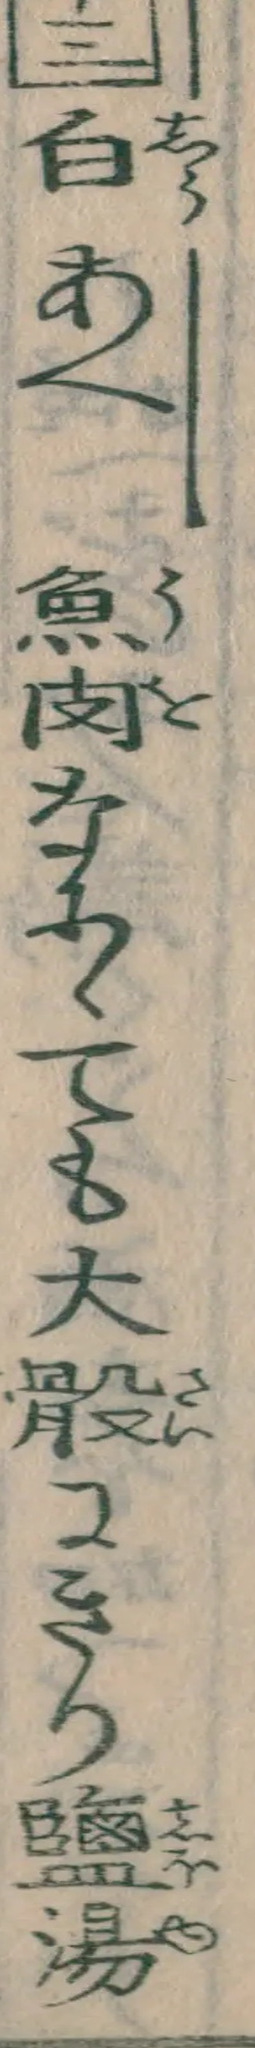十三白あへ魚肉なにゝても大骰にきり塩湯
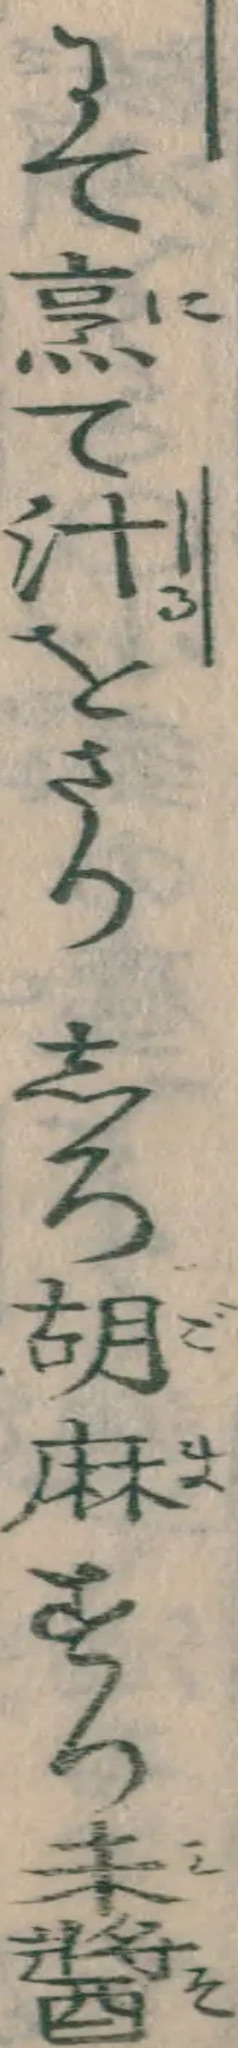にて烹て汁をさりしろ胡麻すり未醤
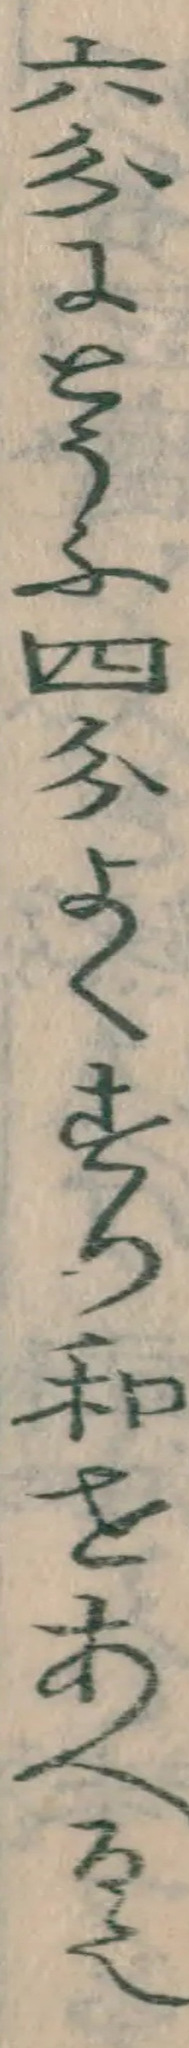六分にとうふ四分よくすり和せあへる也
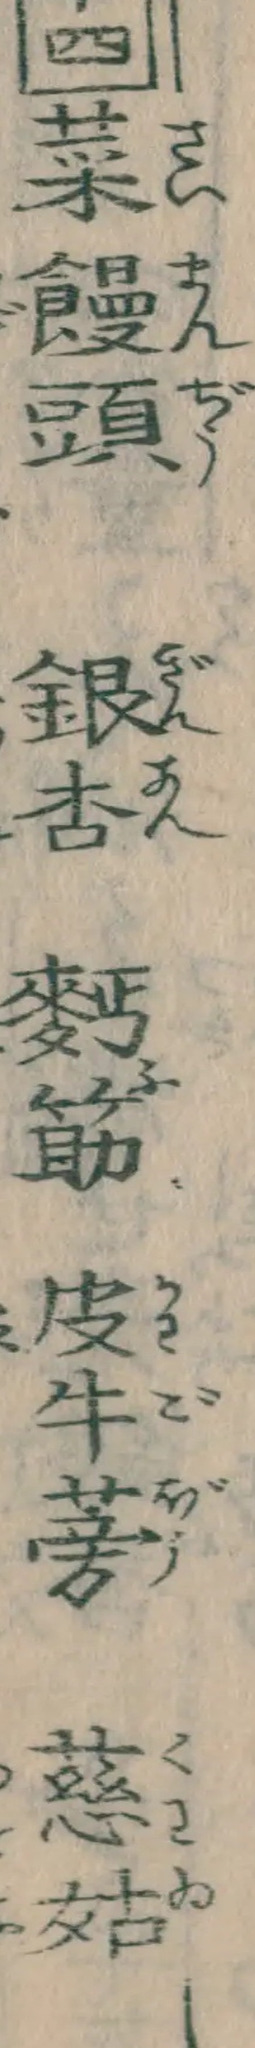十四菜饅頭銀杏麺筋皮午蒡慈姑
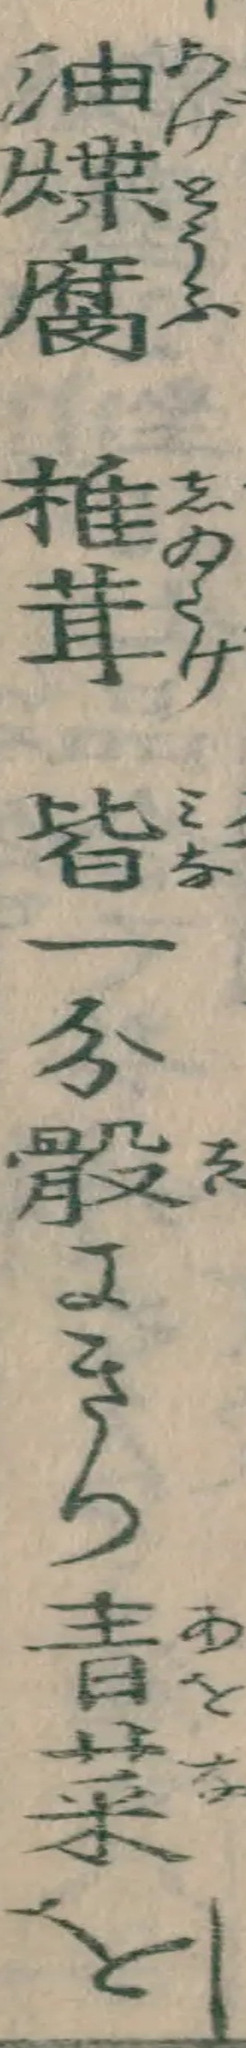油煠腐椎茸皆一分骰にきり青菜を

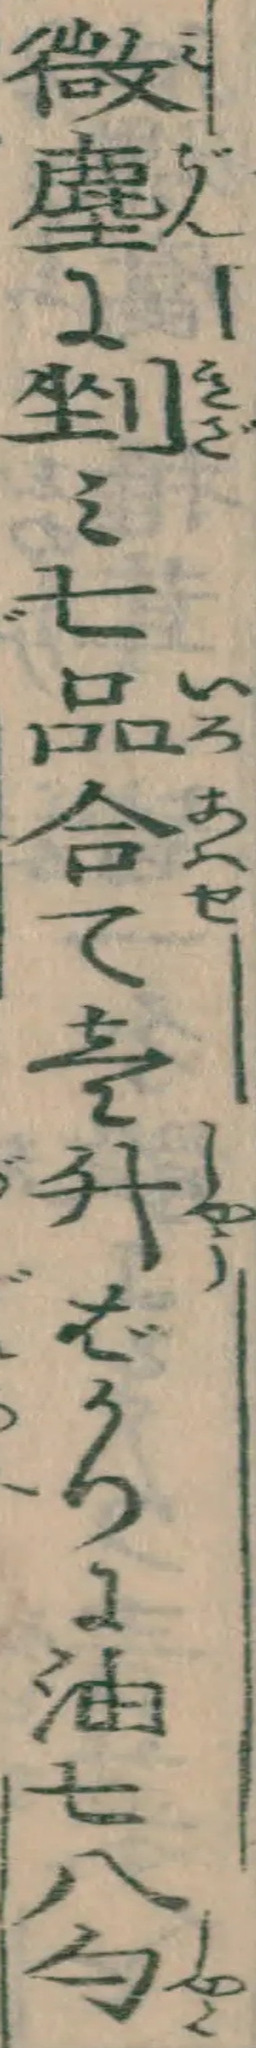微塵に剉み七品合て壱升ばかりに油七八勺
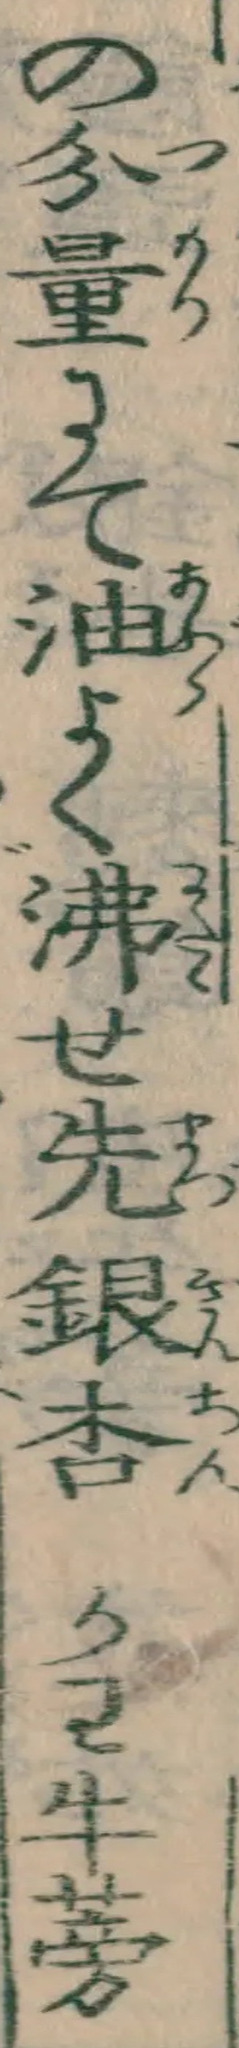の分量にて油よく沸せ先銀杏かわ牛蒡
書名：豆腐百珍. 続編
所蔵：国立国会図書館 National Diet Library, JAPAN
